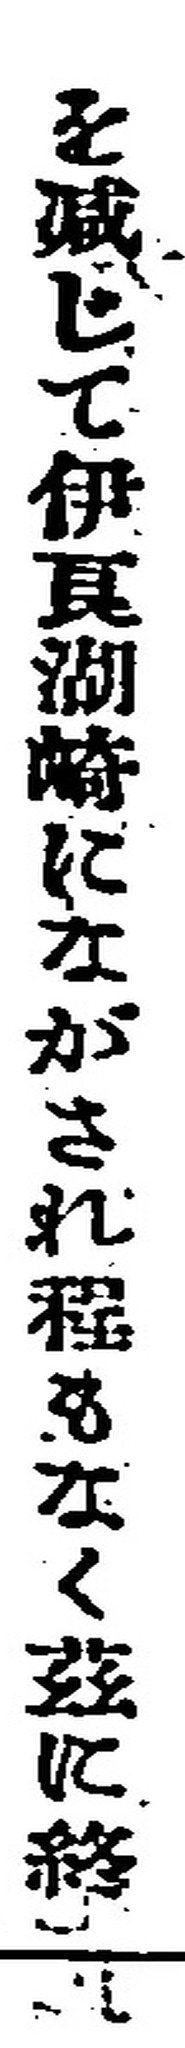を減じて伊良湖崎にながされ程もなく茲に終
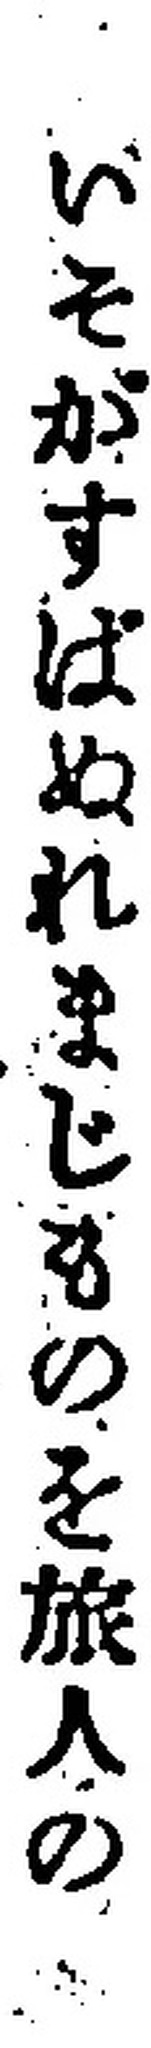いそがすばぬれまじものを旅人の
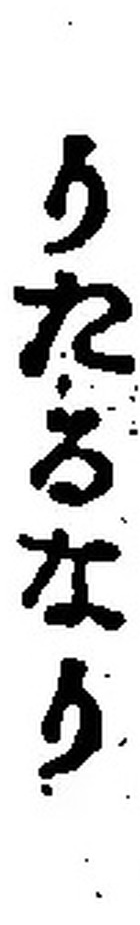りたるなり
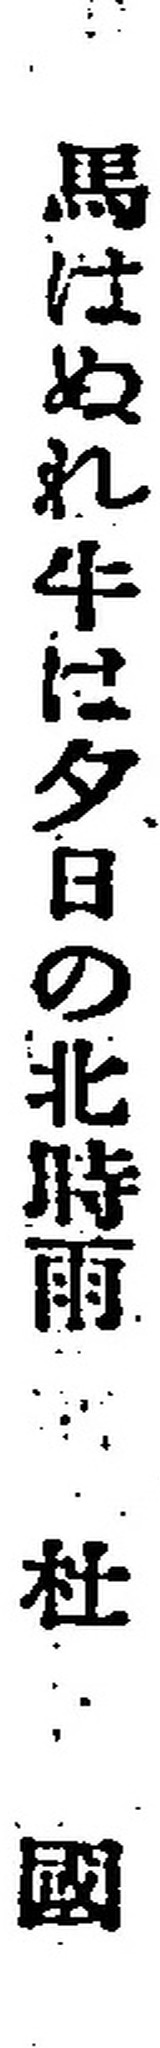馬はぬれ牛は夕日の北時雨杜国
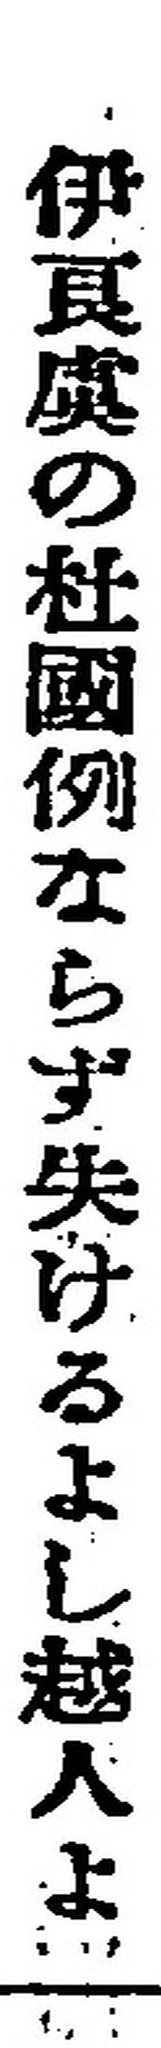伊良虞の杜国例ならず失けるよし越人よ
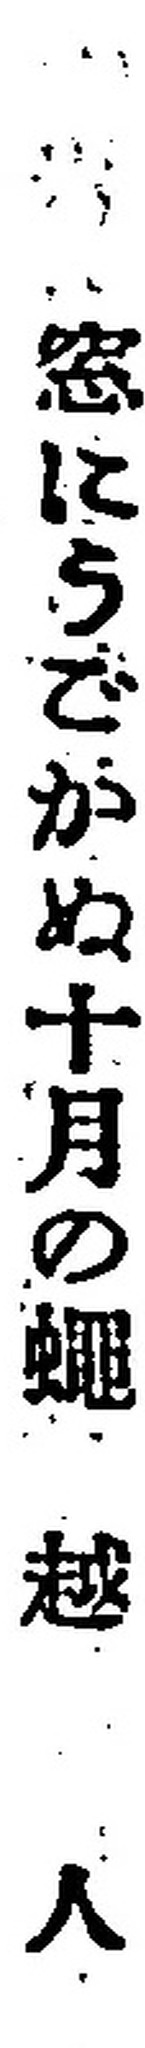窓にうごかぬ十月の蠅越人
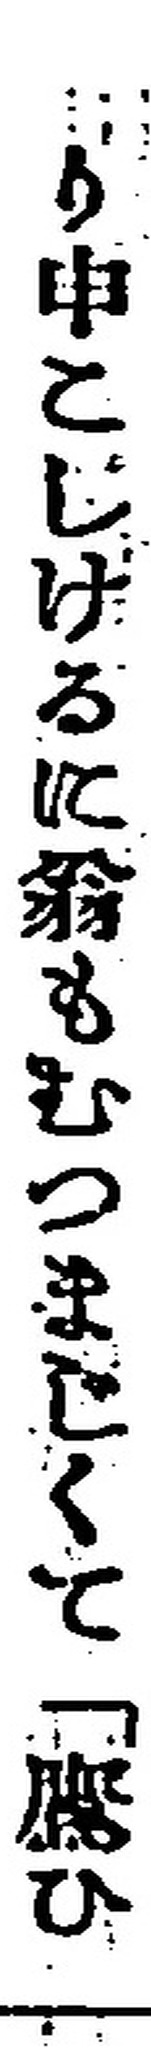り申こしけるに翁もむつまじくて「鷹ひ
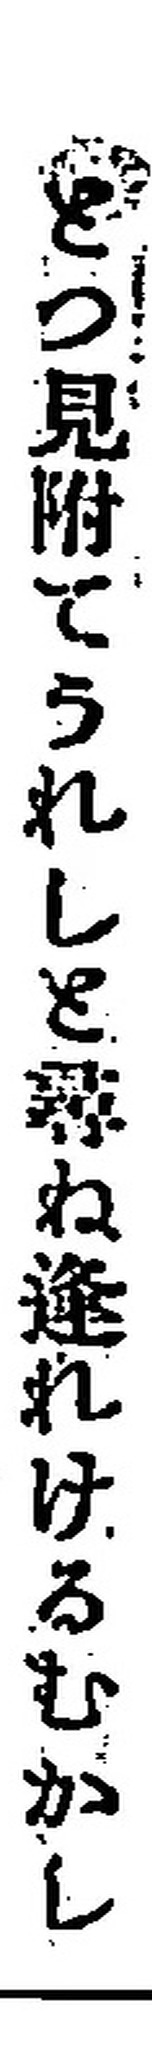とつ見附てうれしと尋ね逢れけるむかし
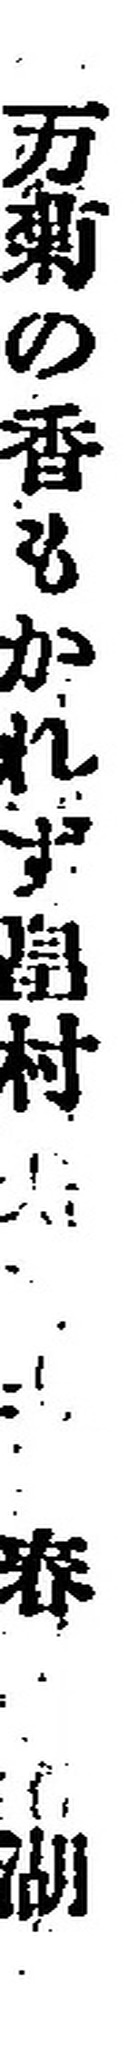万菊の香もかれず畠村春湖
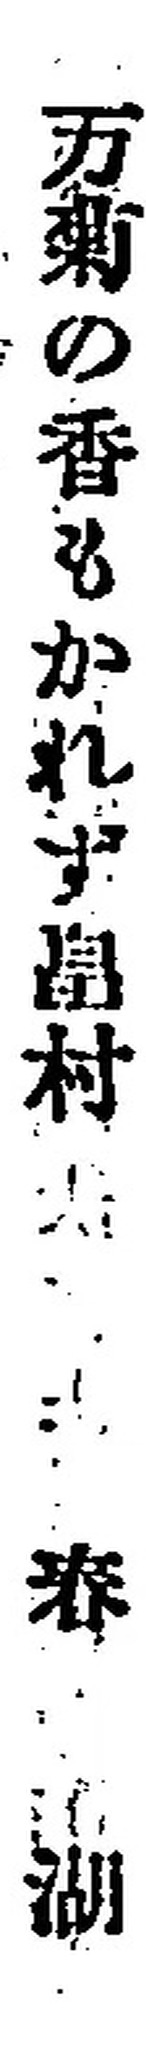万菊の香もかれず畠村春湖
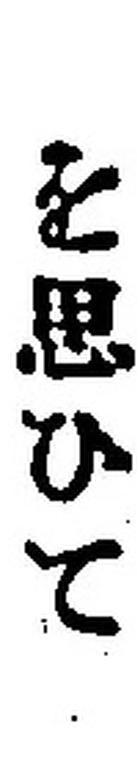を思ひて
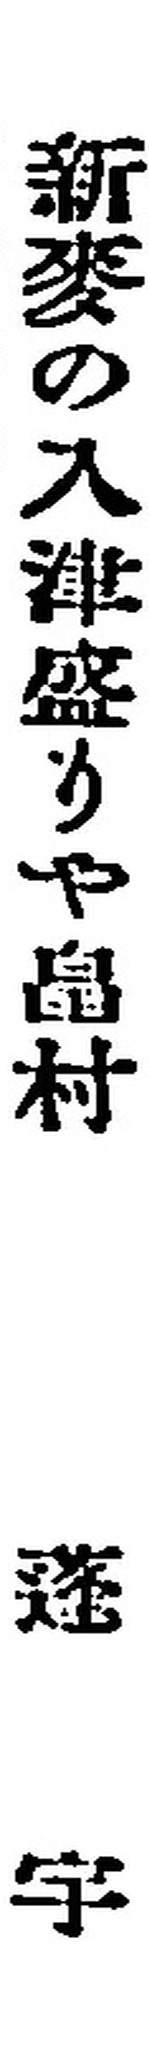新麦の入津盛りや畠村蓬宇
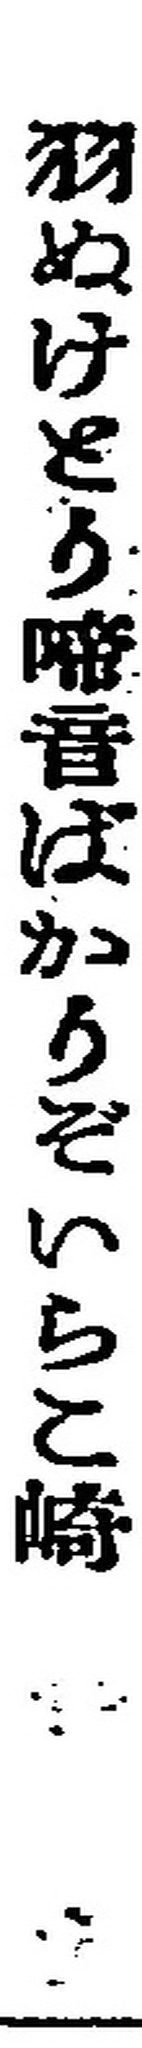羽ぬけとり啼音ばかりぞいらこ崎
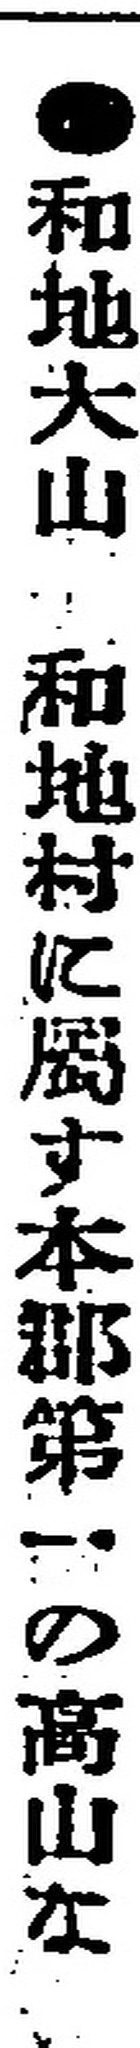●和地大山和地村に属す本郡第一の高山な
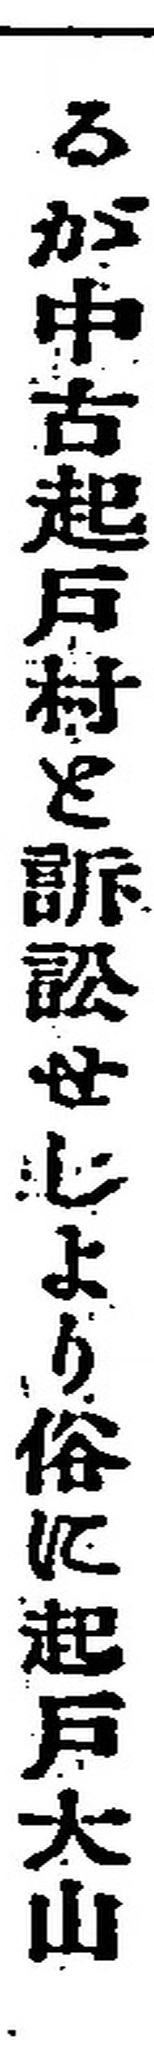るが中古起戸村と訴訟せしより俗に起戸大山
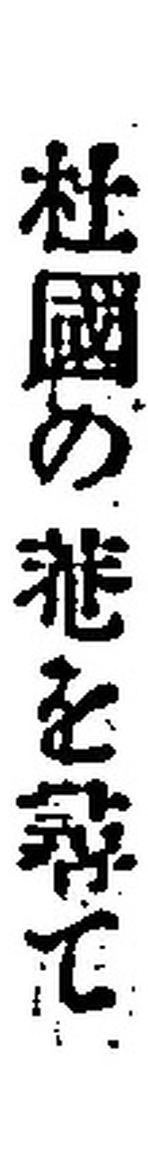杜国の菴を尋て
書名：東参名勝案内
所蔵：国立国会図書館 National Diet Library, JAPAN
